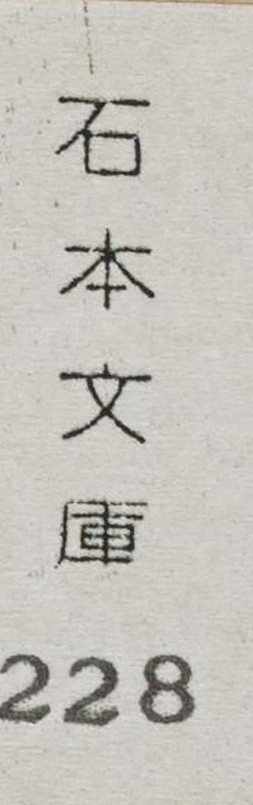石本文庫
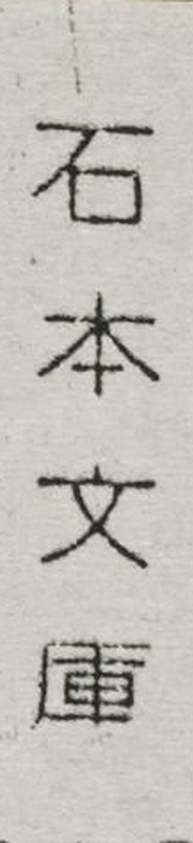石本文庫

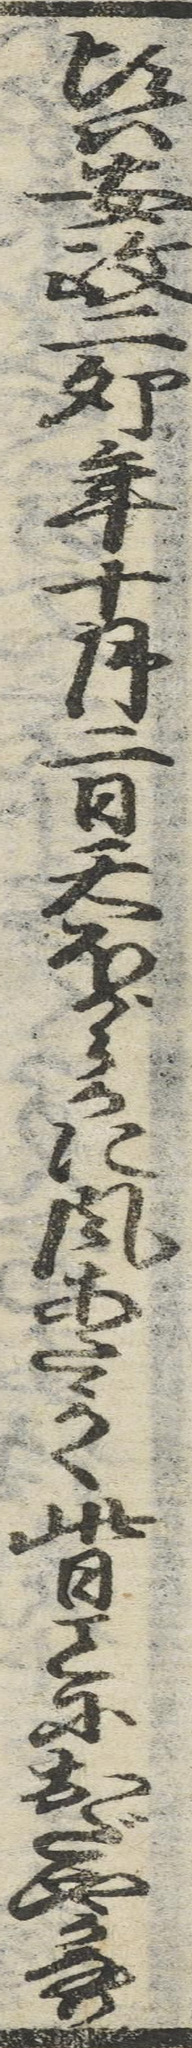頃は安政二卯年十月日天ほからかに風あたゝかく此日ことにおだやかなり
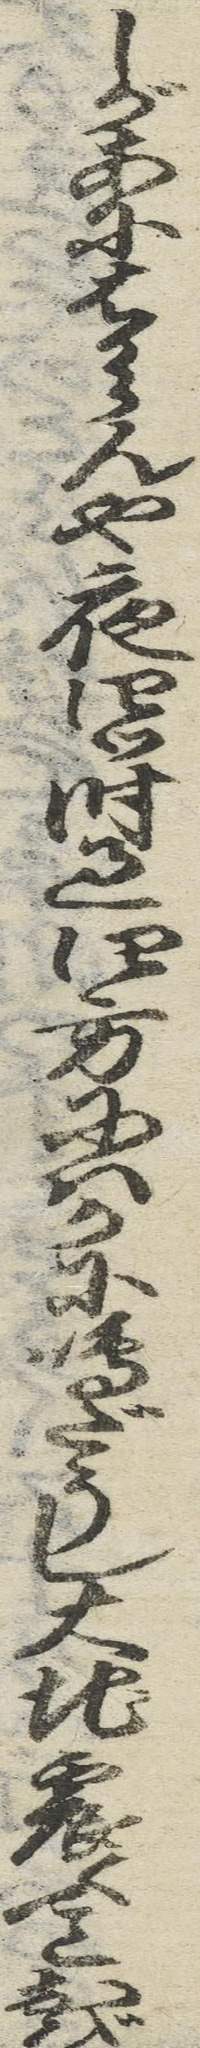しがあにはからんや夜四ツ時過四方にはかに鳴だうし大地震ふことおび
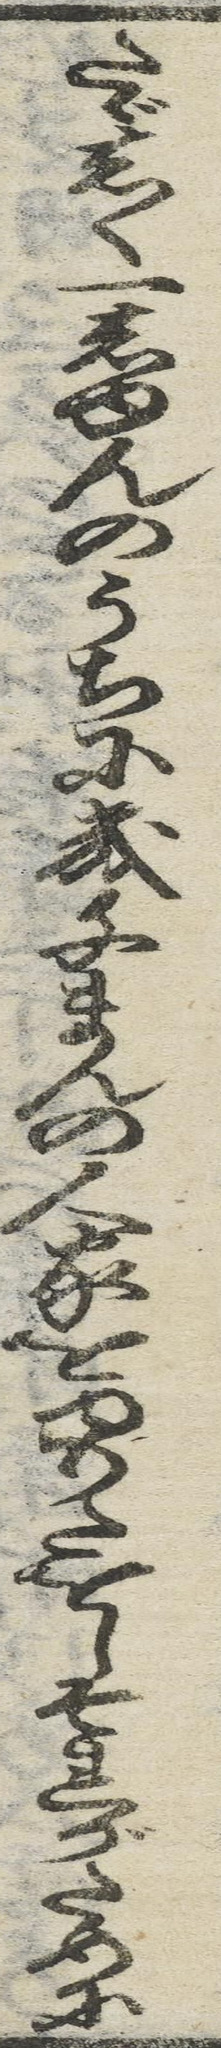たヾしく一しゆんのうちに幾千まんの人家をゆりたをしそれがために
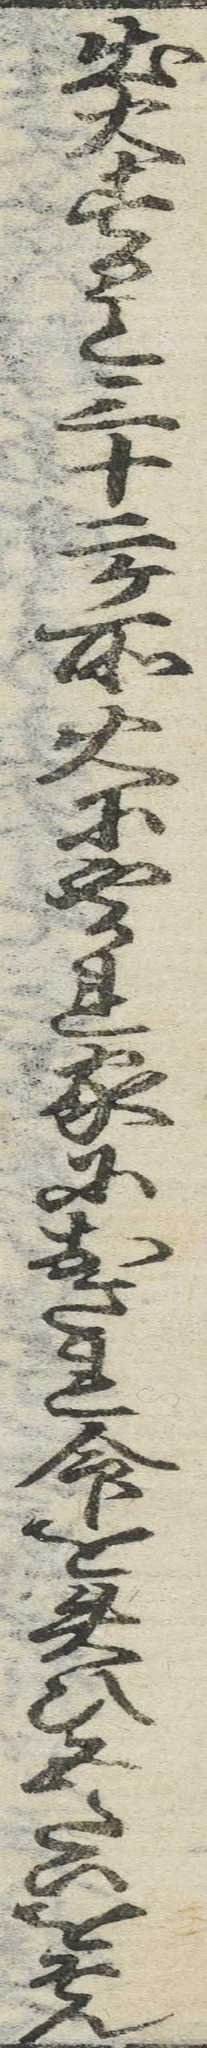出火すること三十二ケ所火にやかれ家におされ命を失ひ五たいをそん
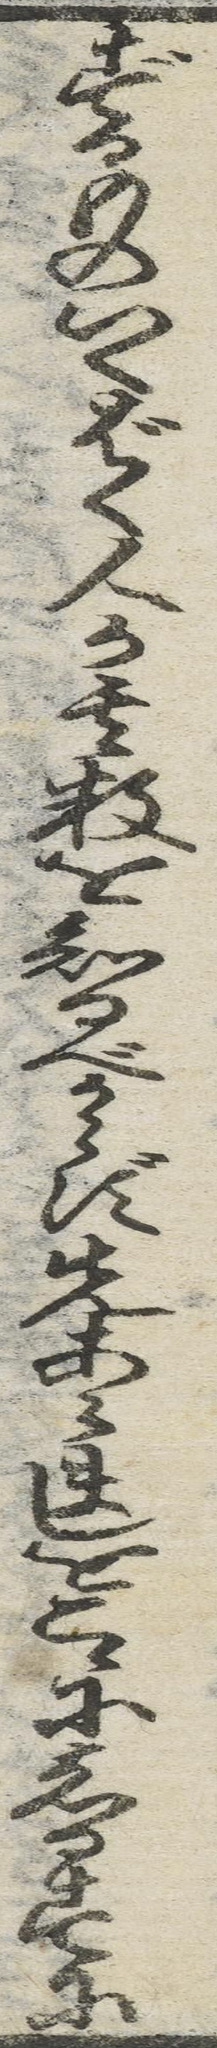ずるものいくばく人か其数を知るべからず先あらましをこヽにしるすに
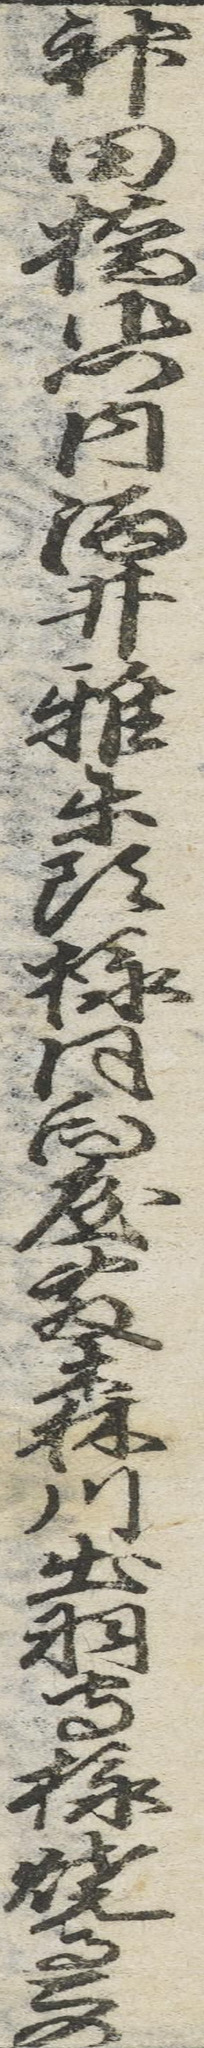神田橋御門内酒井雅楽頭様向屋敷森川出羽守様焼るこの
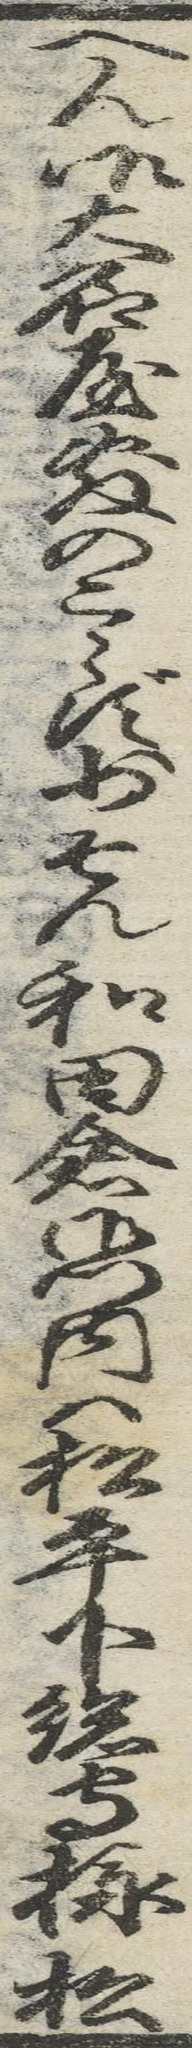へん御大名屋敷のこらず御そん和田倉御門内は松平下総守様松
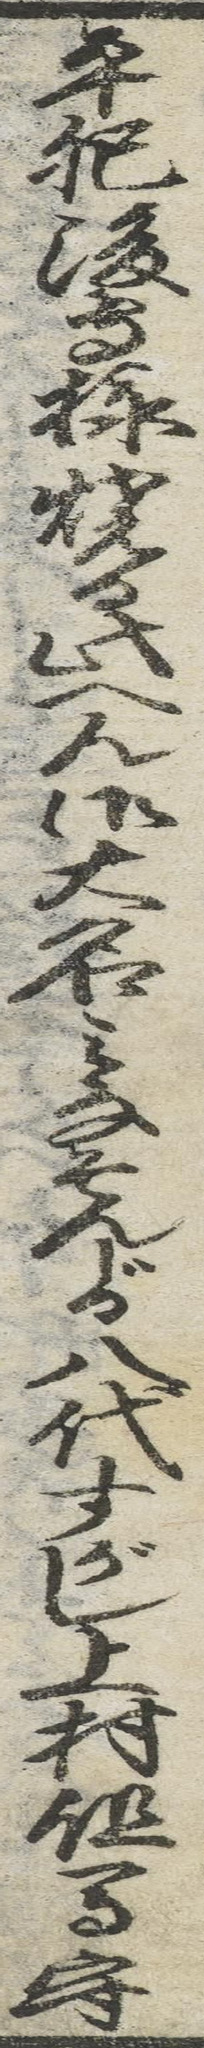平肥後守様焼る此へん御大名みなそんじる八代すがし上村但馬守
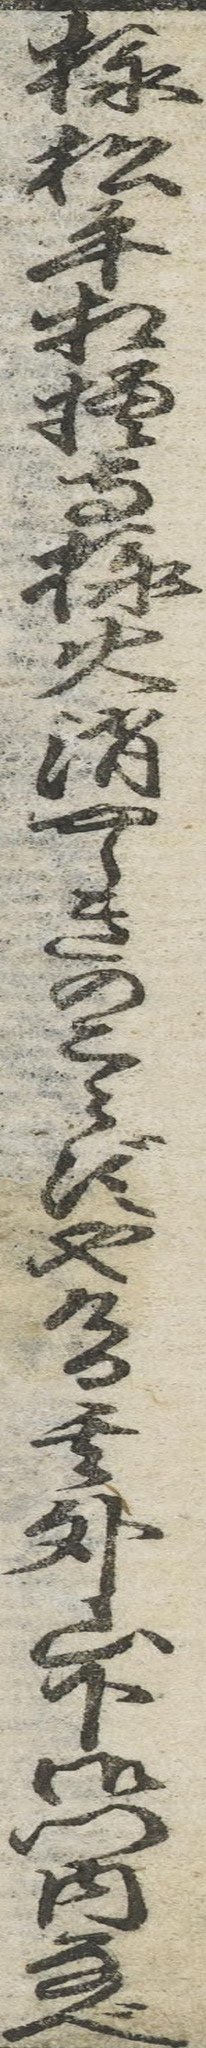様松平相模守様火消やしきのこらずやける其他山下御門内なべ
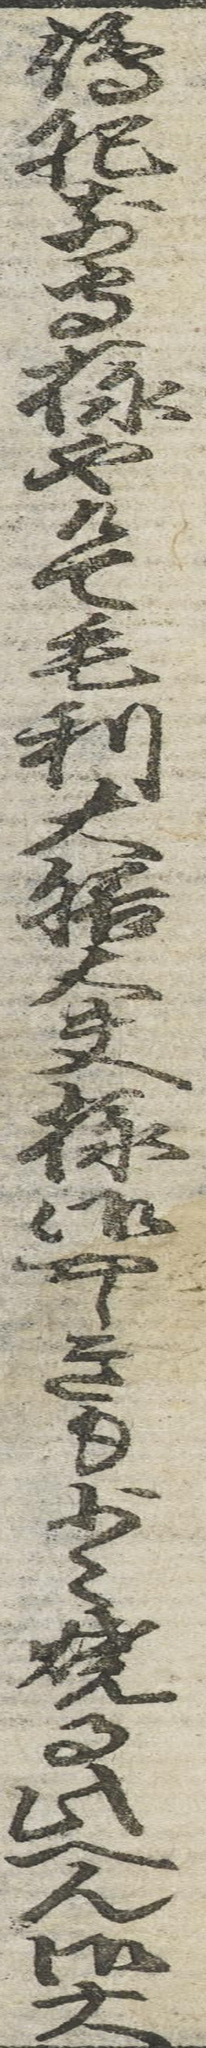嶋肥前守様やけて毛利大膳大夫様御やしきも少〻焼る此へん御大

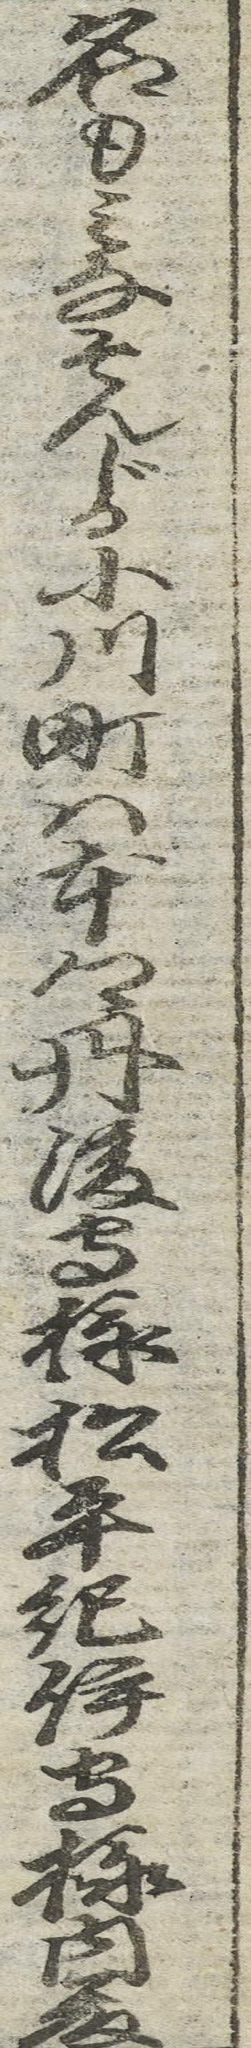名もみなそんじる小川町は本郷丹後守様松平紀伊守様内藤
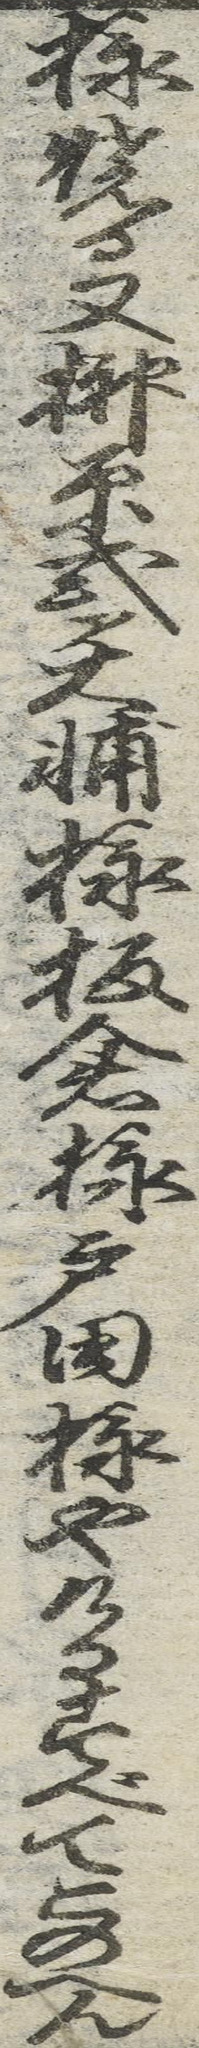様焼る又榊原式部大輔様板倉様戸田様やけるすべてこのへん
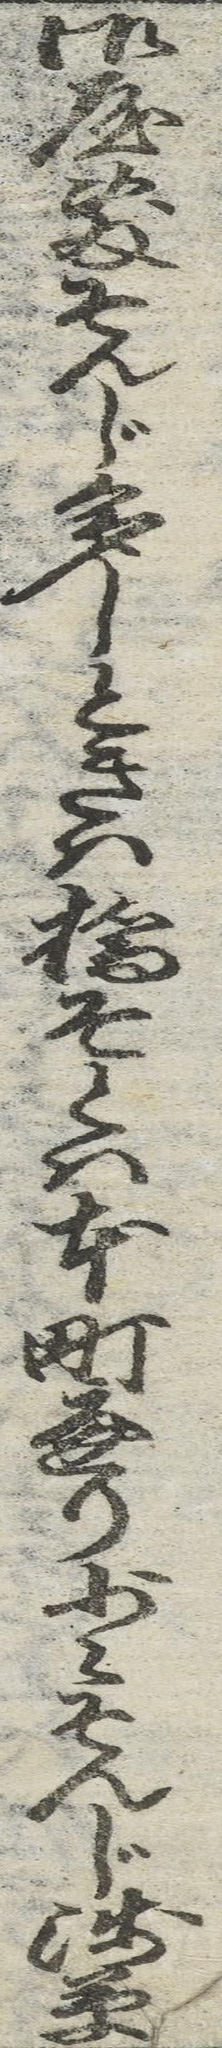御屋敷そんじ多しときは橋そとは本町通り少々そんじ浅草
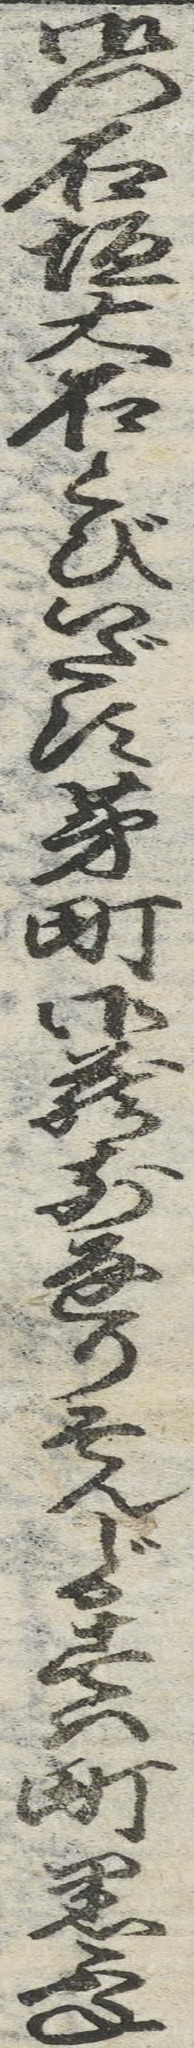御門石垣大石とびいだす茅町御蔵前通りそんじるすは町黒ふね
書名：関東　大地震細記
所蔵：東京大学地震研究所図書室 Earthquake Research Institute Library, The University of Tokyo, JAPAN
